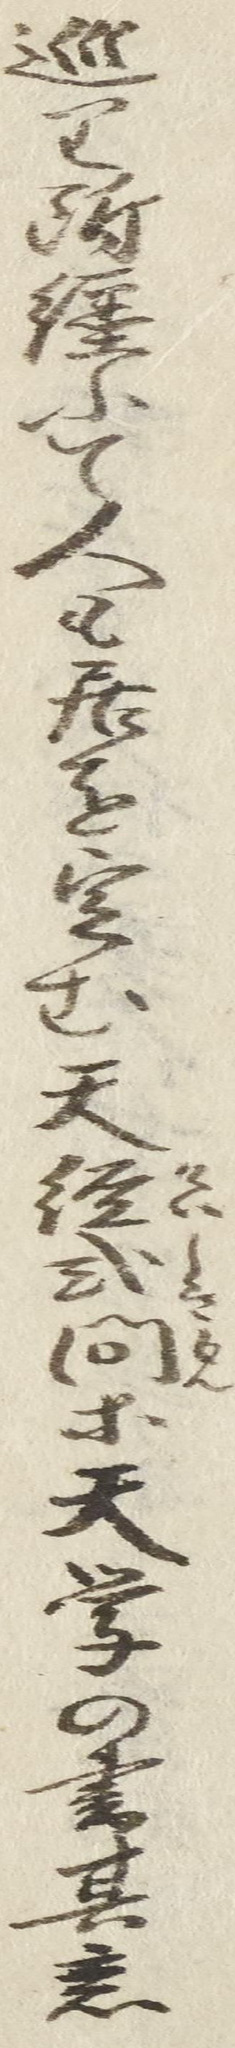巡り附纏にて人も居を定む天徑式問等天学の書其意
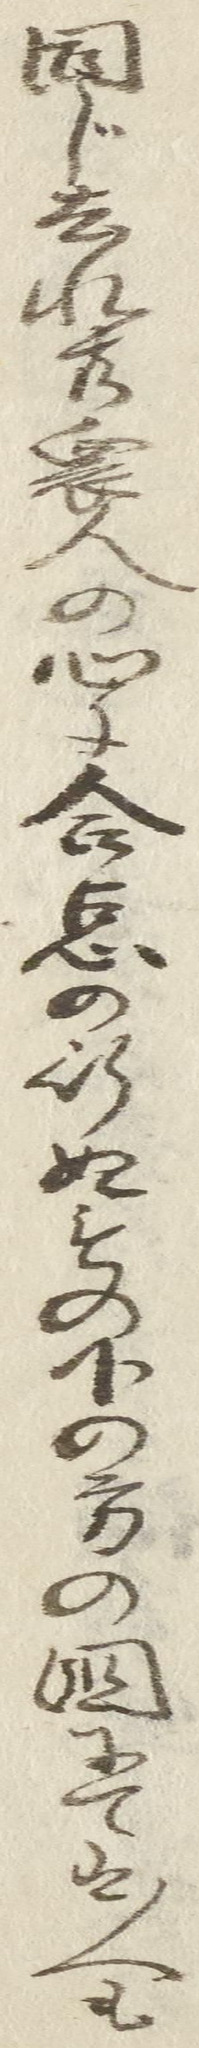同じ去れ共衆人の心に合点の行ぬもの下の方の国にては人も
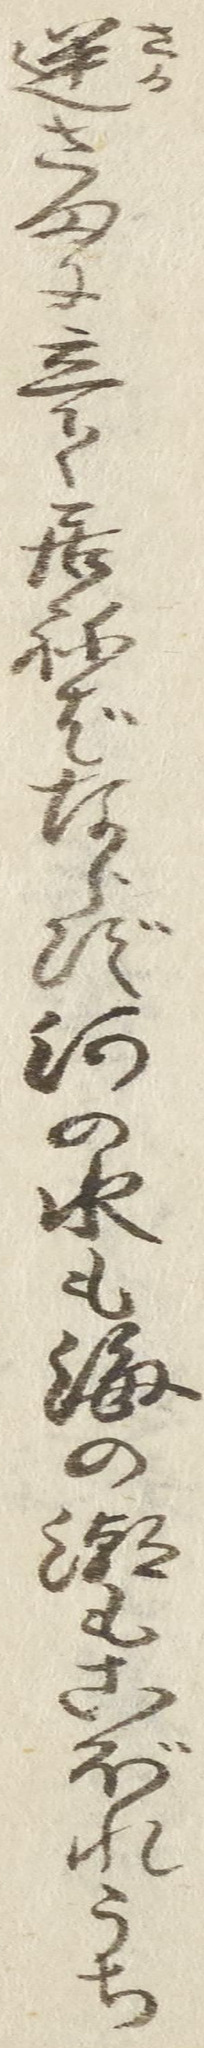逆さまに立て居ねばならず河の水も海の潮もこぼれうち
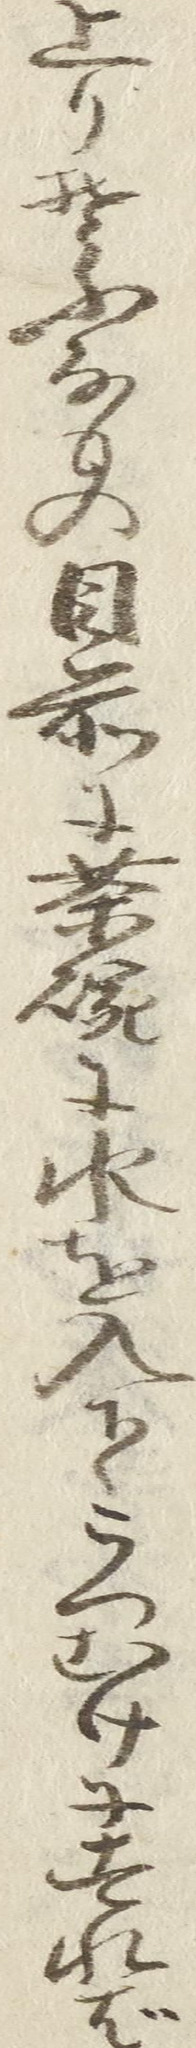上りそふなるもの目前に茶碗に水を入てうつむけにすれば
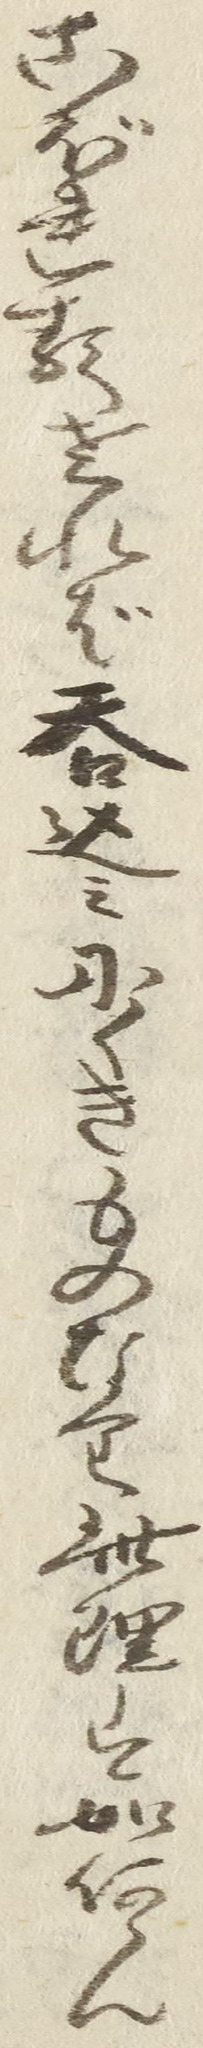こぼれるされば吞込みにくきものなり無理は如何ん
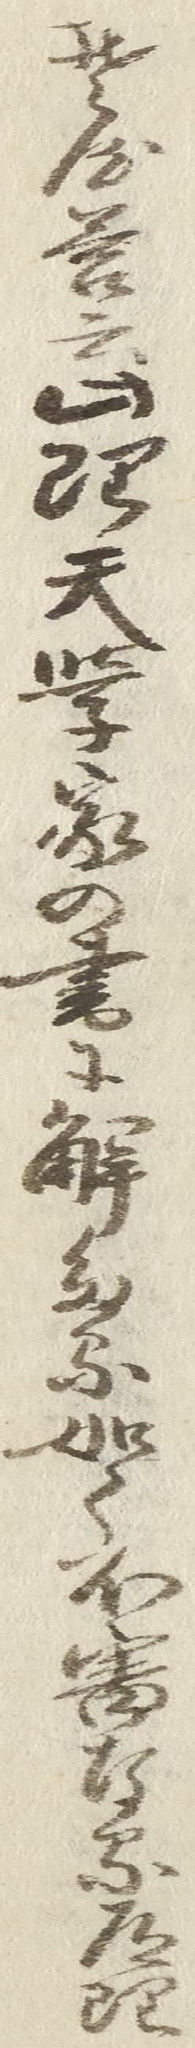さらば答云此理天学家の書に解たる如く不審なる道理
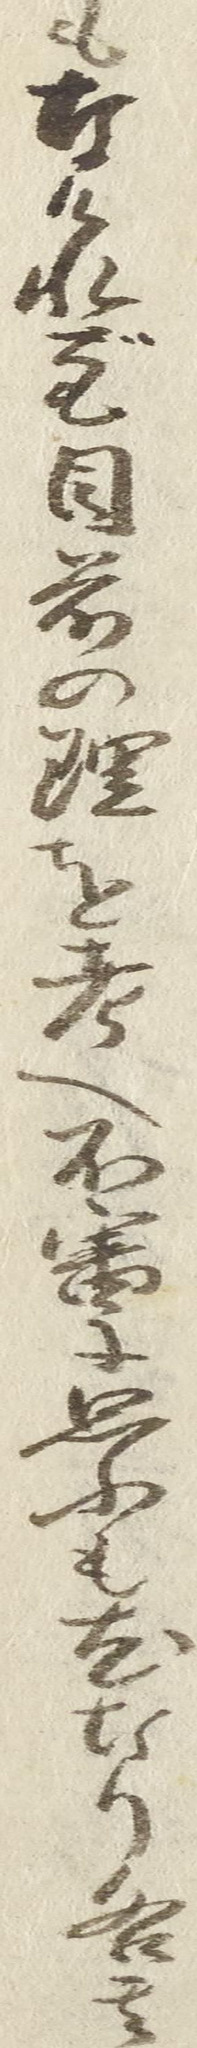もなければ目前の理を考へ不審に思ふも尤なり右は
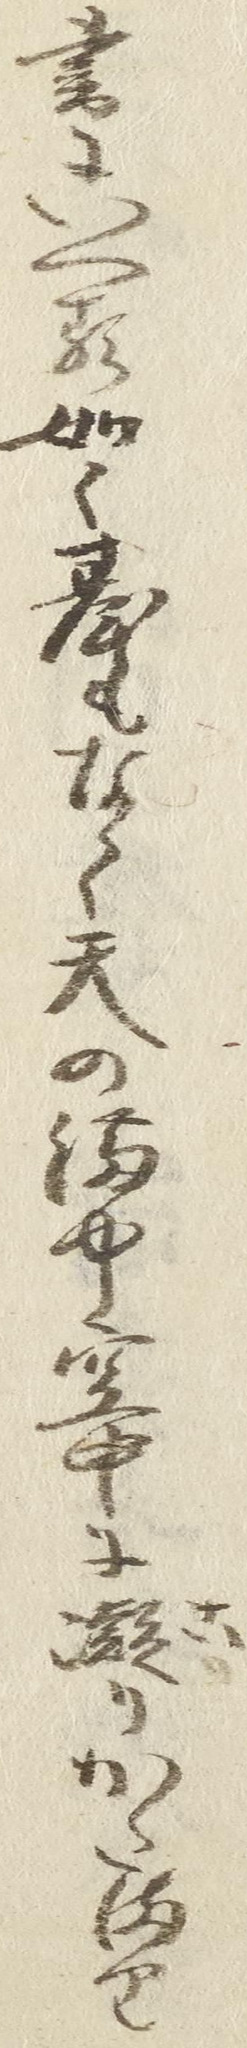書にいへる如く台もなく天の備ゆへ空中に凝りかたまり
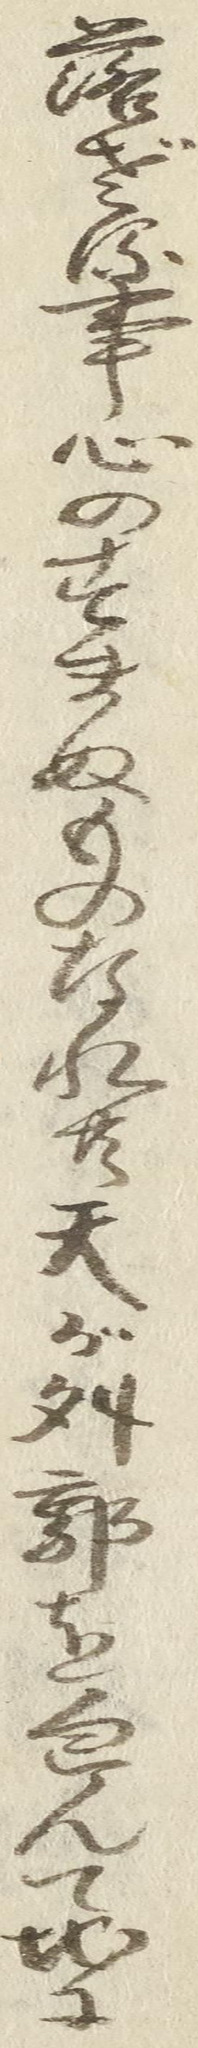落ざる事心のすまぬものなれ共天が外郭を包んて地に
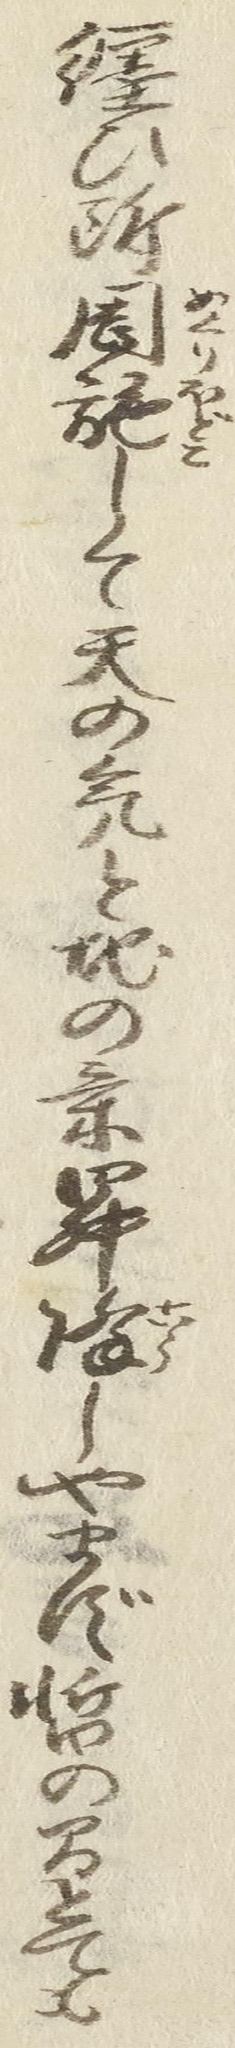纏ひ所周施して天の気と地の気昇降しやまず暫の間とても
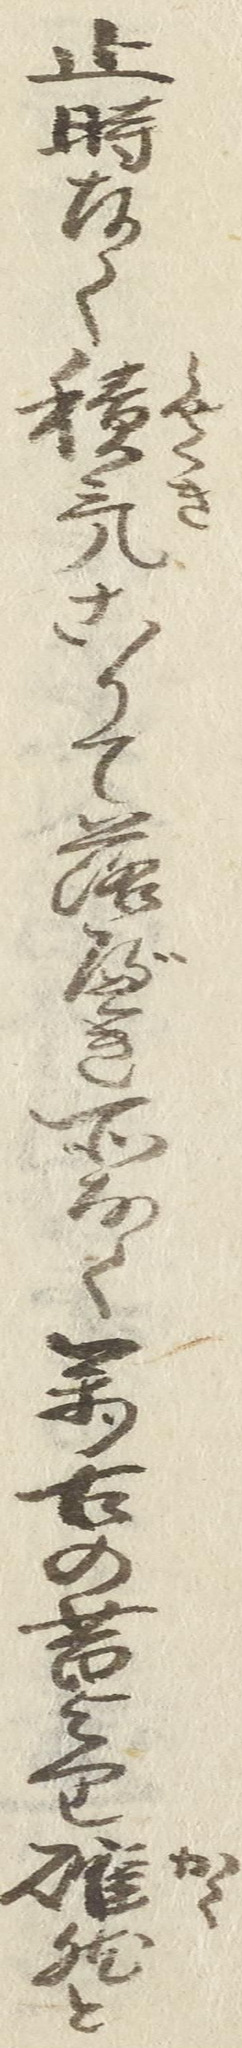止時なく積気こりて落べき所なく万古の昔より確然と
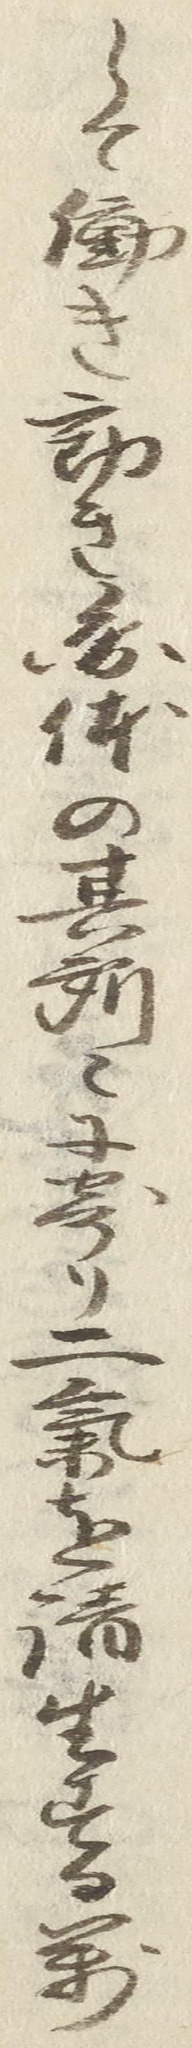して働き動き円体の其所々に寄り二気を請生する万
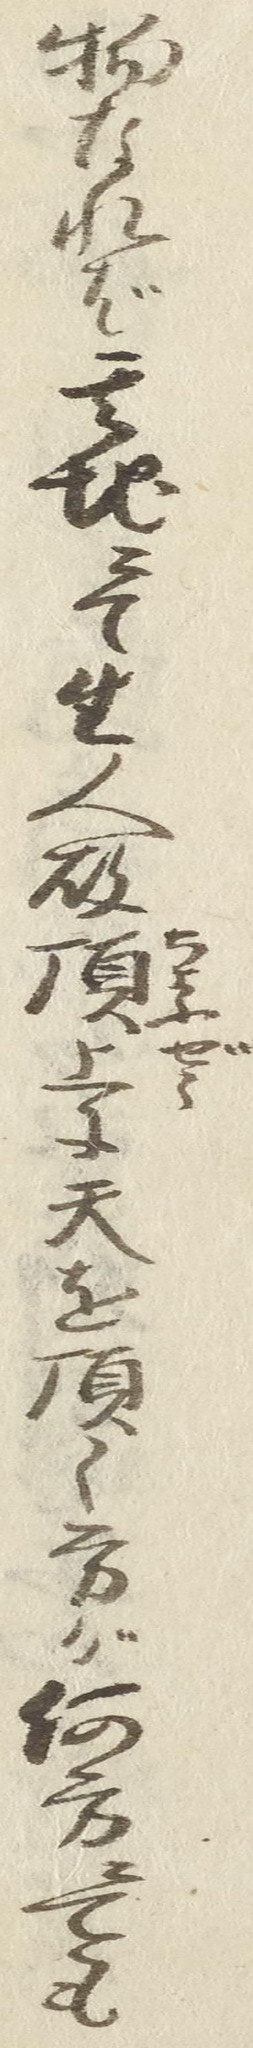物ならば其地にて生人故頂上に天を頂方が何方にても
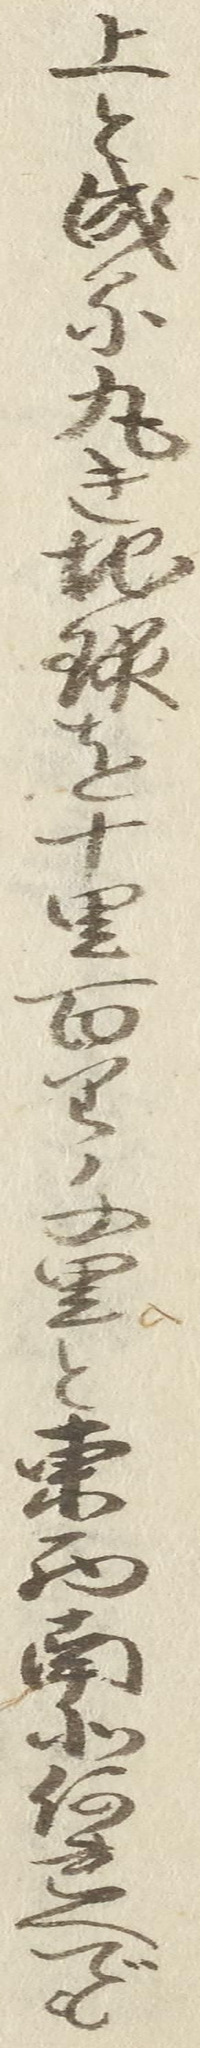上となる丸き地球を十里百里千里と東西南北あれへども
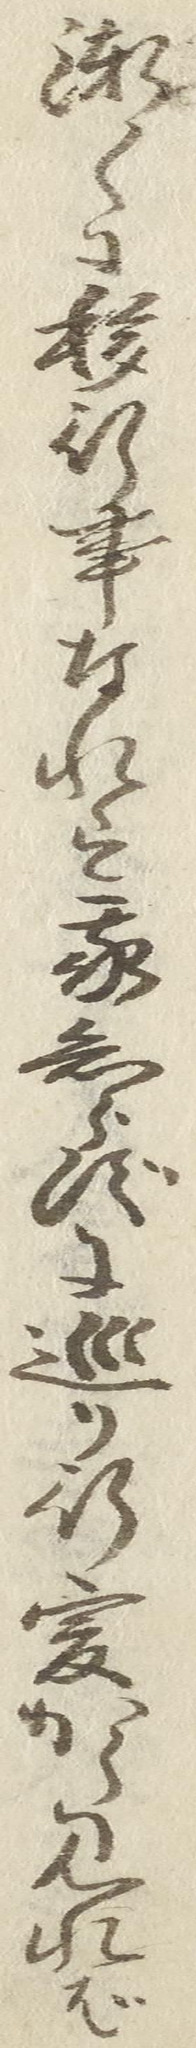漸くに移行事なれと我知らずに巡り行爰から見れば
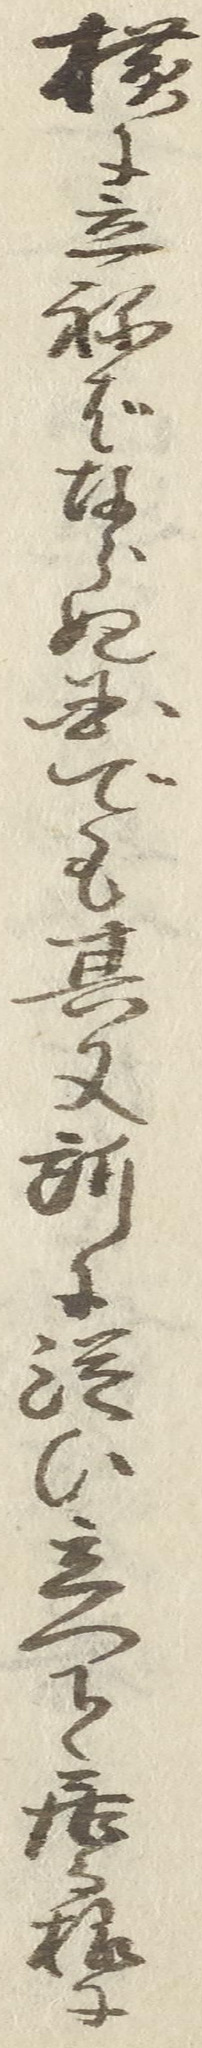横に立ねばならぬ国でも其又所に従ひ立つて居る様子
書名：従往古地震御届書記誌之一
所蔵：東京大学地震研究所図書室 Earthquake Research Institute Library, The University of Tokyo, JAPAN
